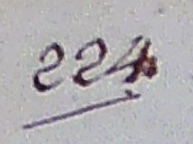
224.
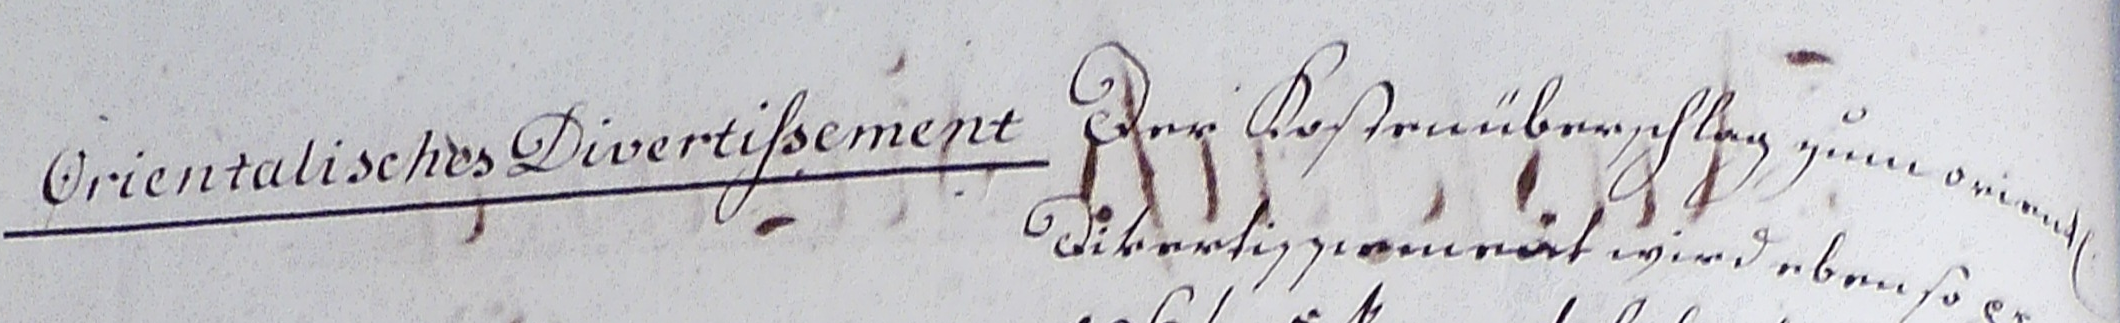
Orientalisches Divertissement Der Kostenüberschlag zum orientL.
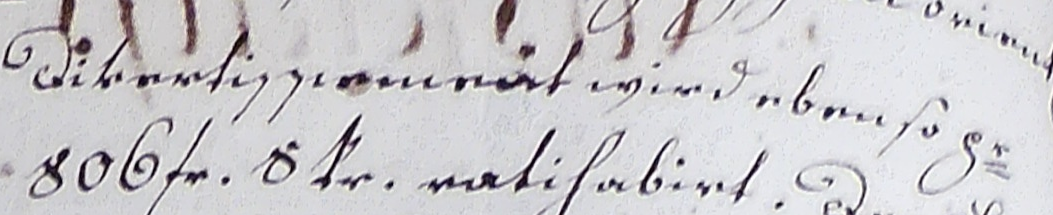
Divertissement wird ebenso pr͇
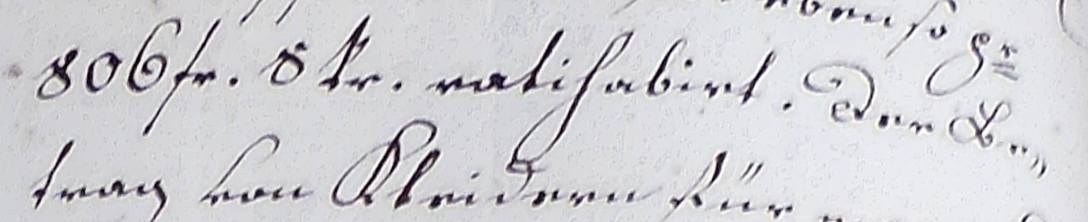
806fr. 8kr. ratihabirt. Der An¬
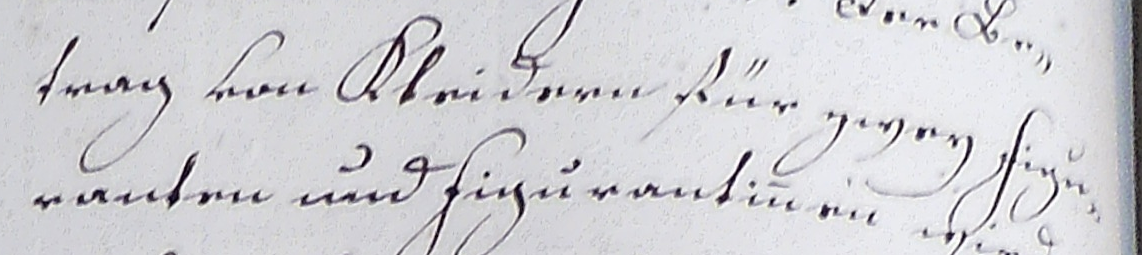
trag von Kleidern für zwey Figu¬
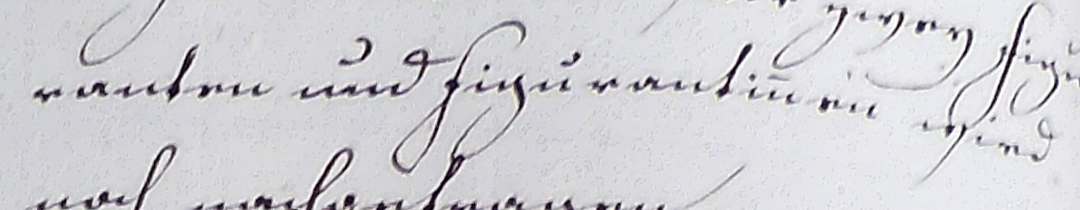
ranten und Figurantin̅en wird
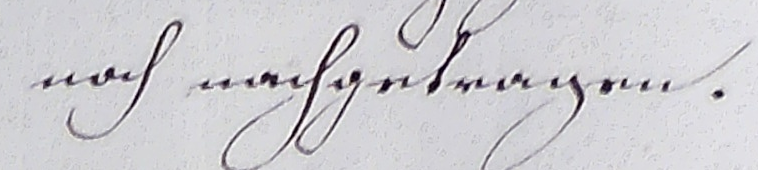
noch nachgetragen.
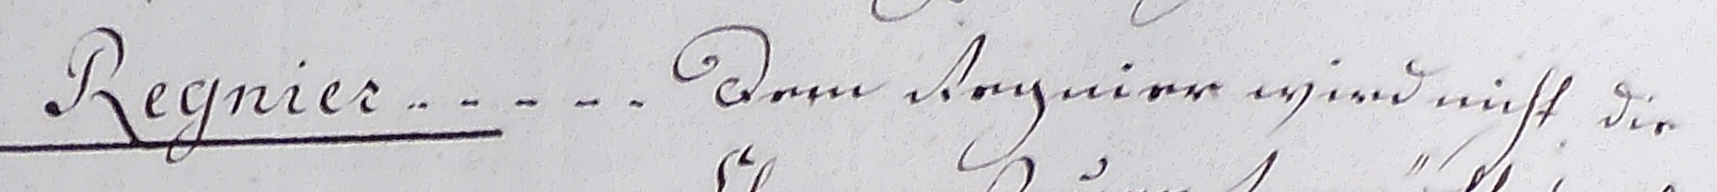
Regnier .. .. .. .. .. Den Regnier wird nicht die
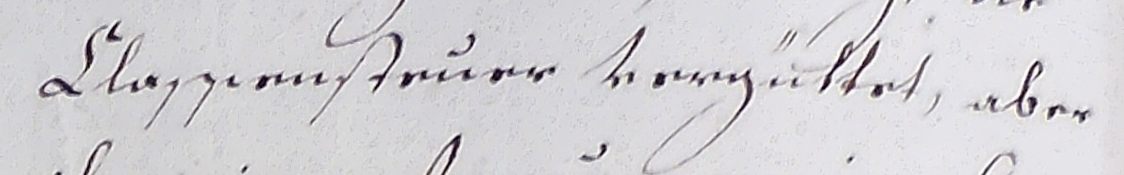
Classensteuner vergüttet, aber
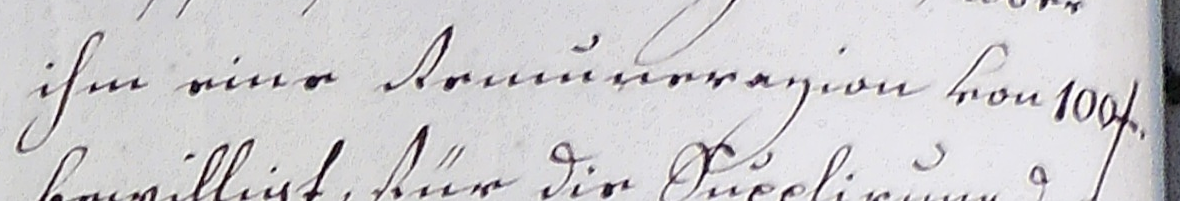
ihm eine Remunerazion von 100fr.
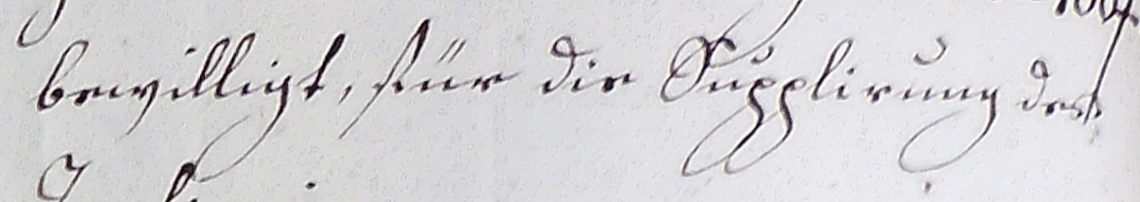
bewilligt, für die Supplirung des
